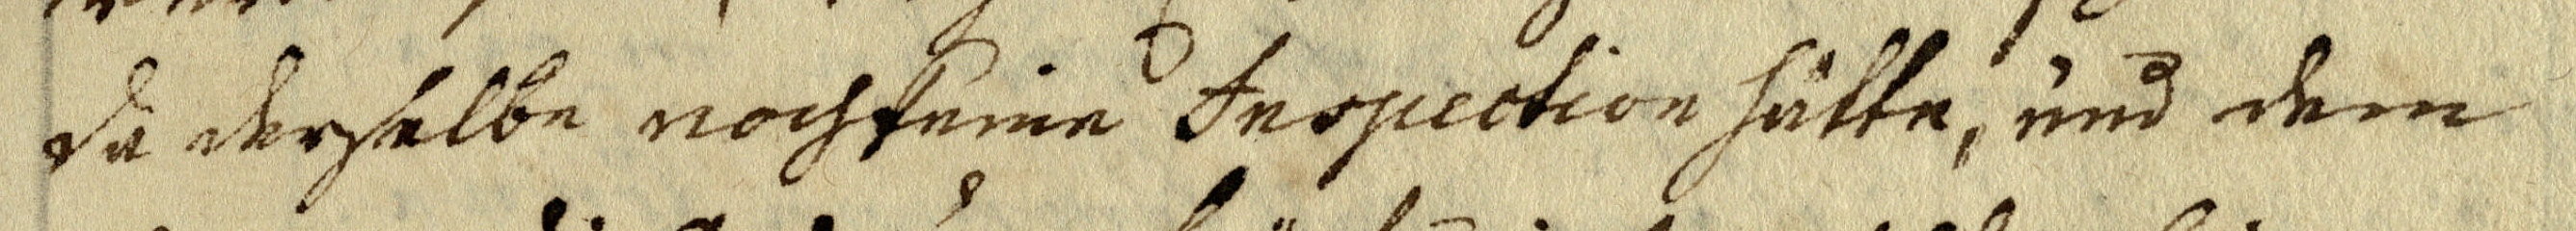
da derselbe nochkeine Inspection hätte, und dem
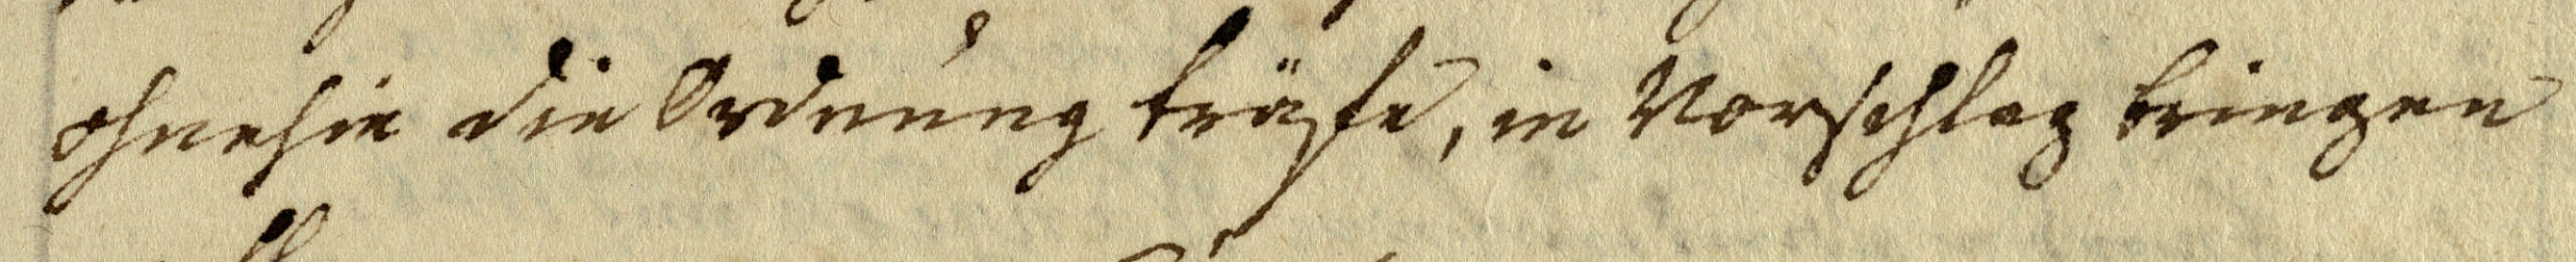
ohnehin die Ordnung träfe, in Vorschlag bringen
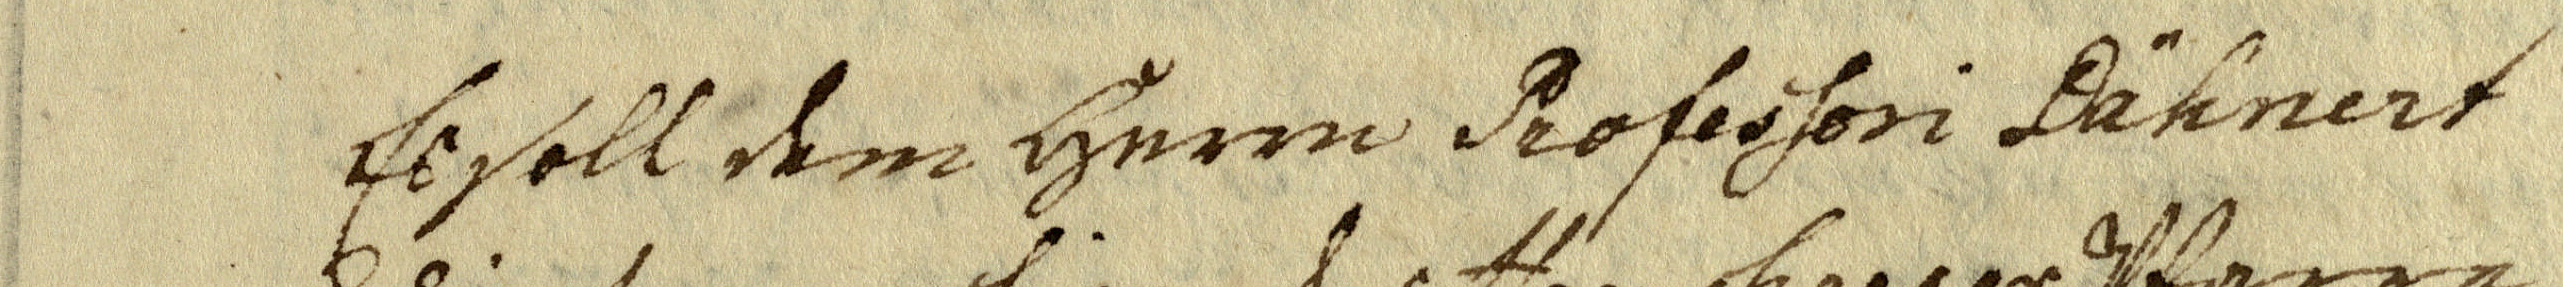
Es soll dem Herrn Professori Dähnert
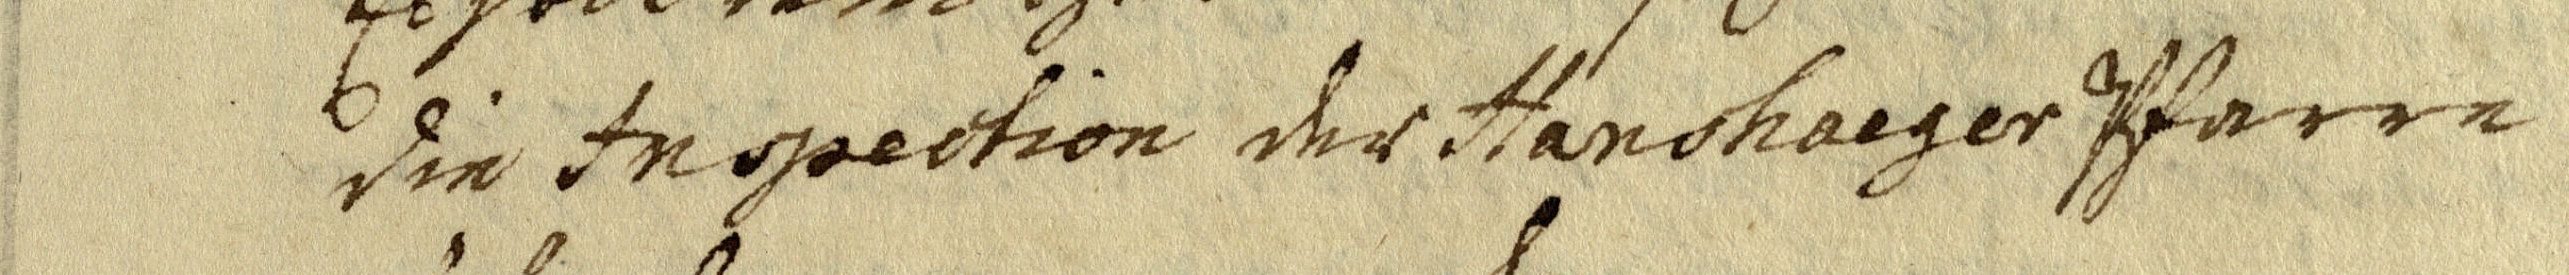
die Inspection der Hanshaeger Pfarre
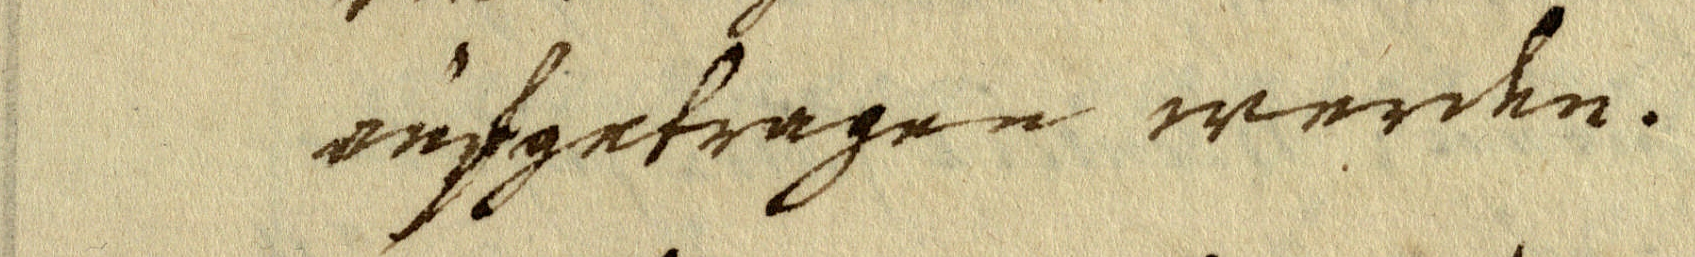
aufgetragen werden.
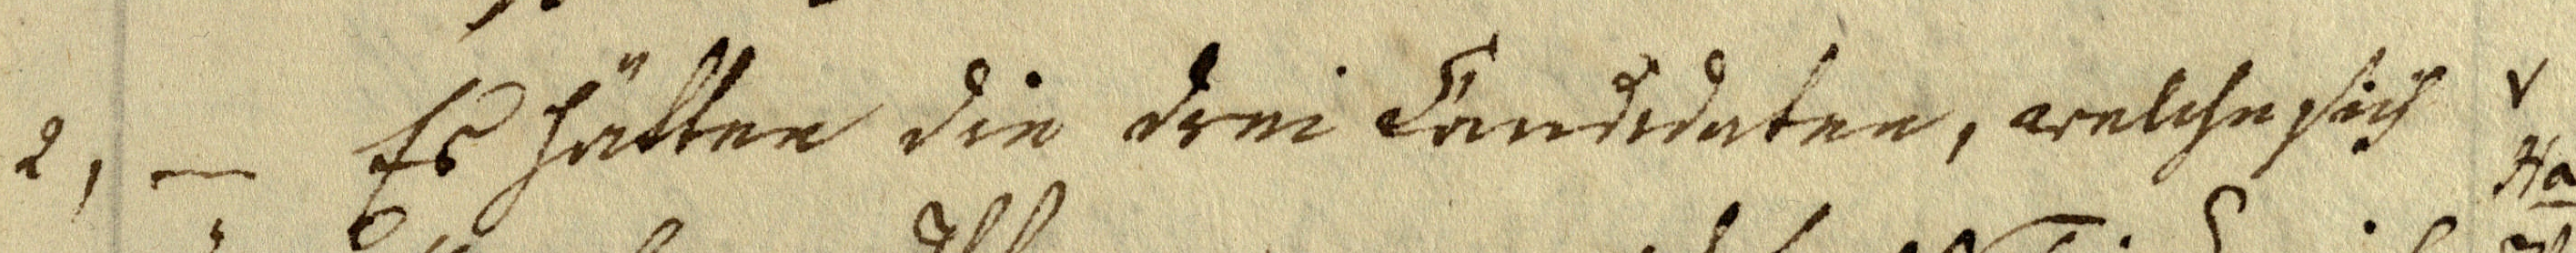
2. Es hätten die drei Candidaten, welche sich Hanshaeger
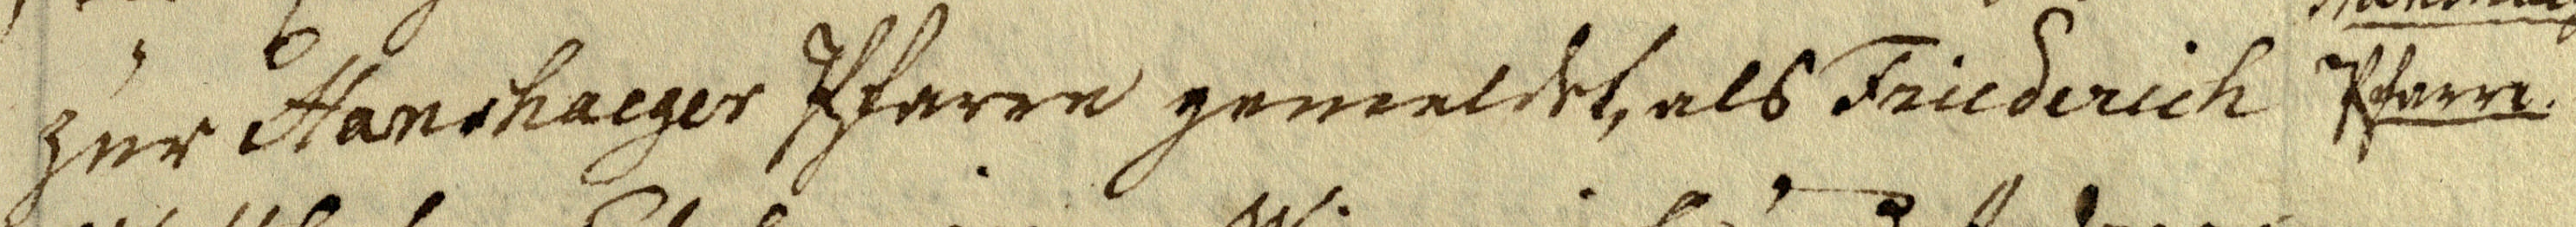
zur Hanshaeger Pfarre gemeldet, als Friederich Pfarre
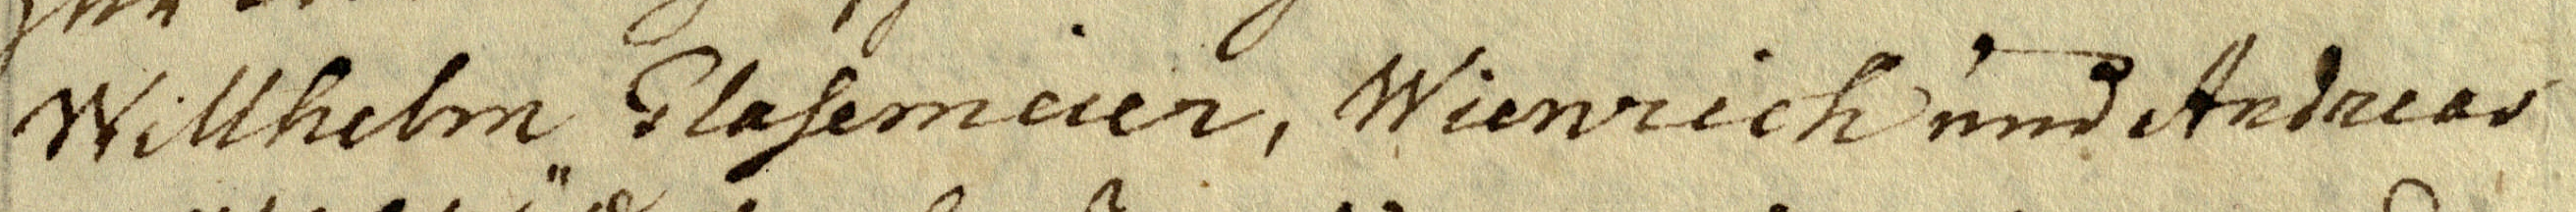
Wilhelm Glasemeier, Wienrich und Andreas
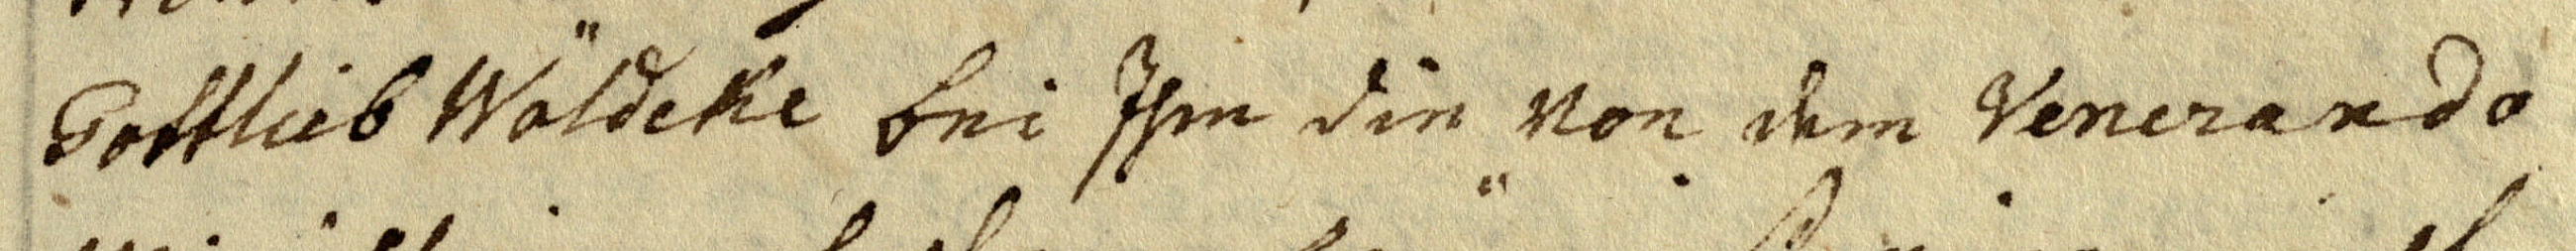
Gottlieb Wöldeke bei Ihm die von dem Venerando
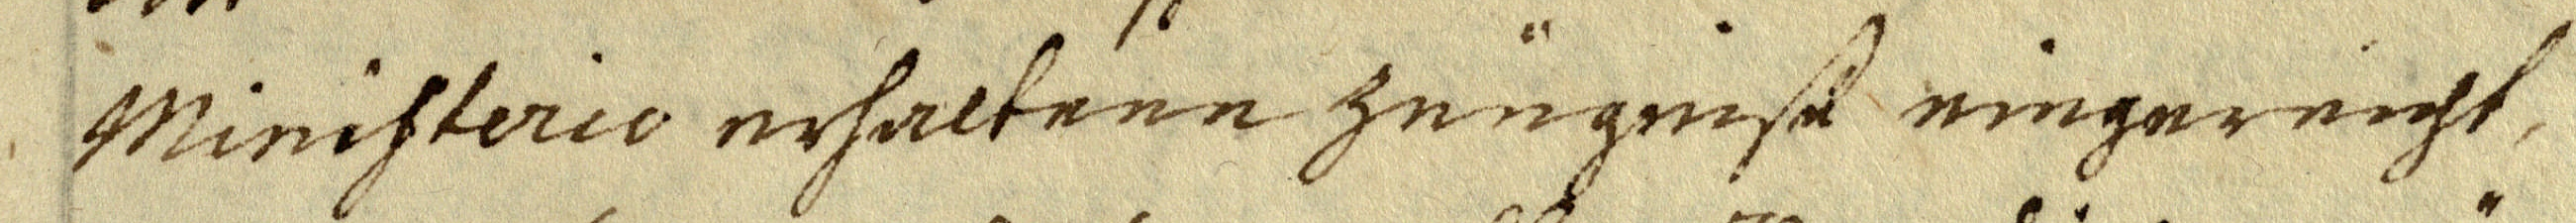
Ministerio erhaltene Zeugniße eingereicht
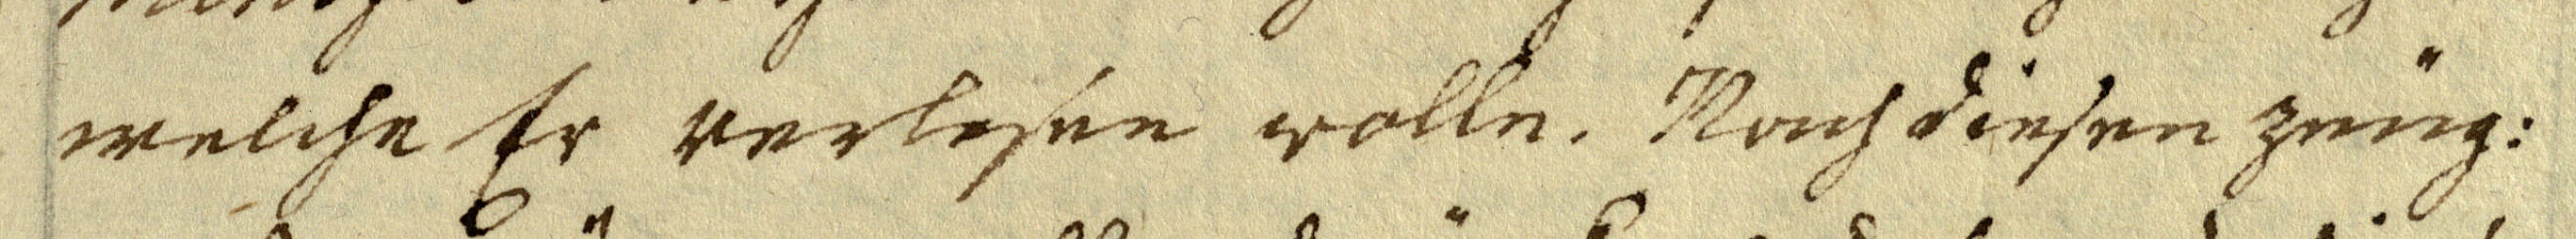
welche Er verlesen wolle. Nach diesen zeug¬
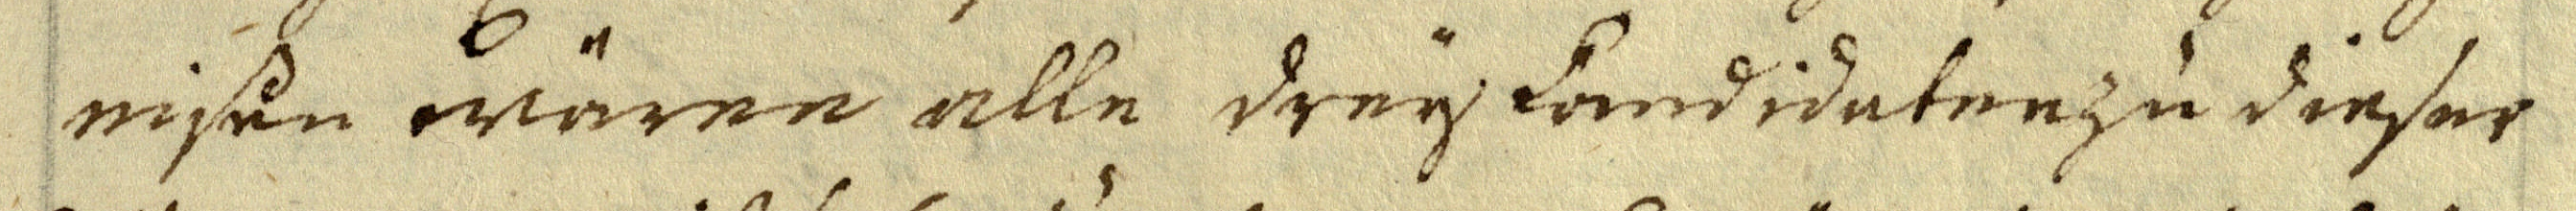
nißen wären alle dreÿ Candidaten zu dieser
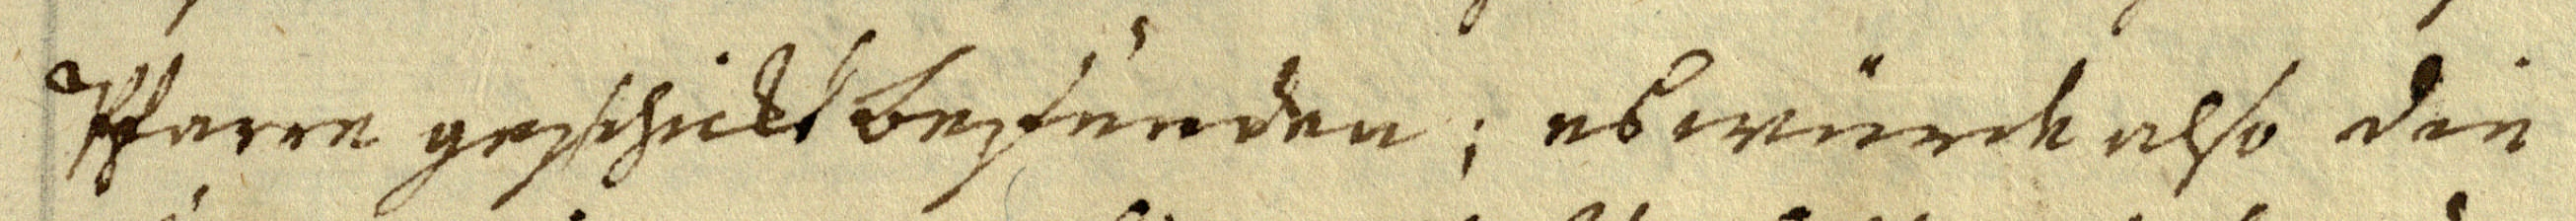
Pfarre geschickt befunden, es würde also die
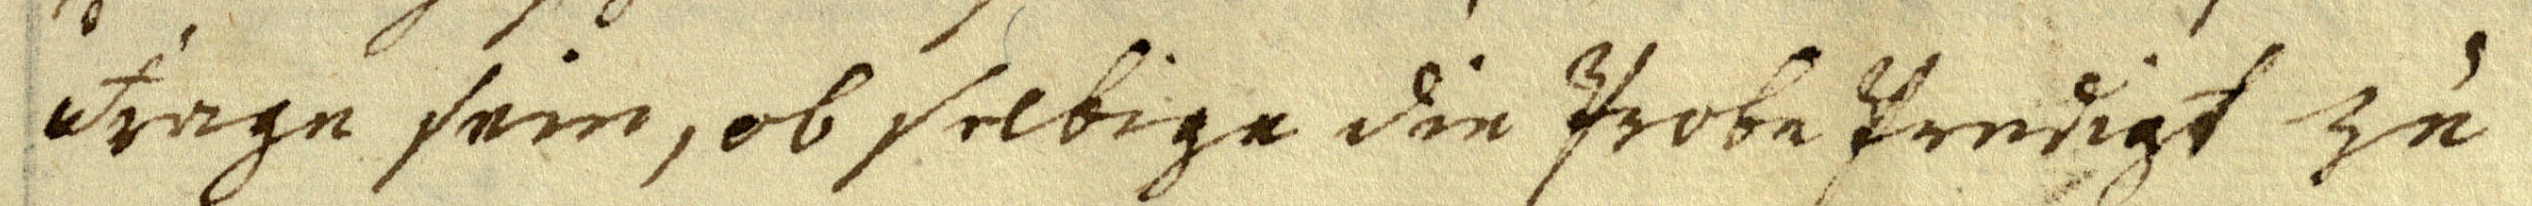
Frage sein, ob selbige die Probe Predigt zu
